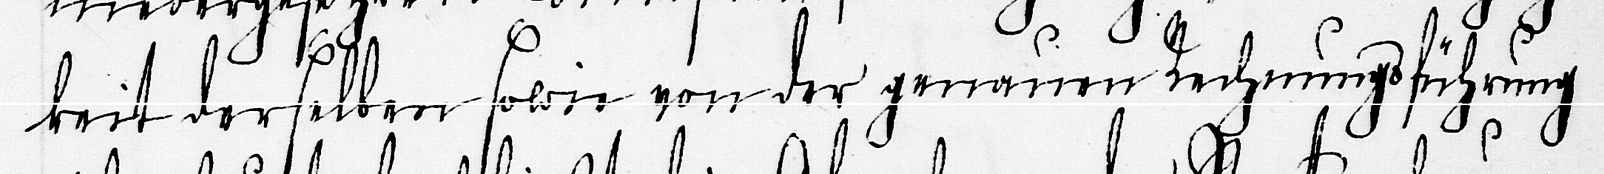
keit derselben sowie von der genauen Rechnungsführung
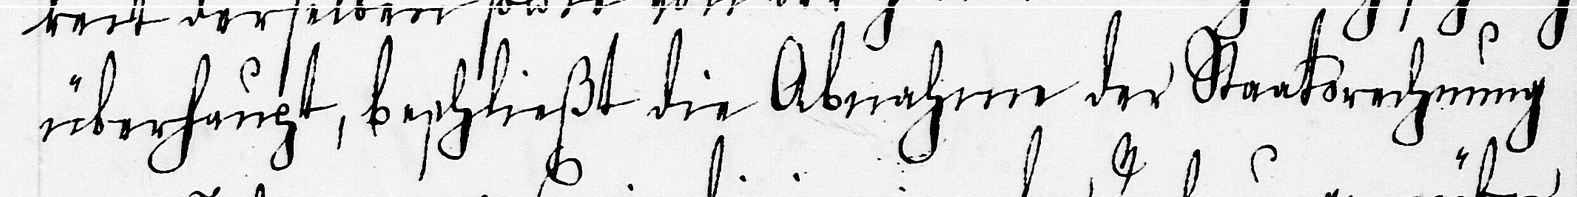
überhaupt, beschließt die Abnahme der Staatsrechnung
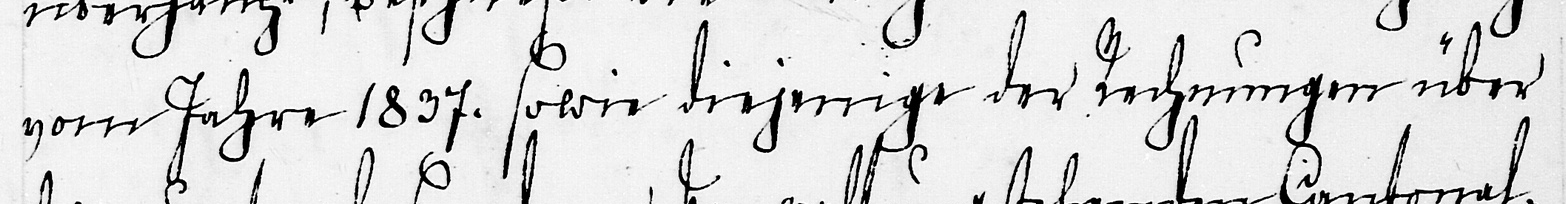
vom Jahre 1837. sowie diejenige der Rechnungen über
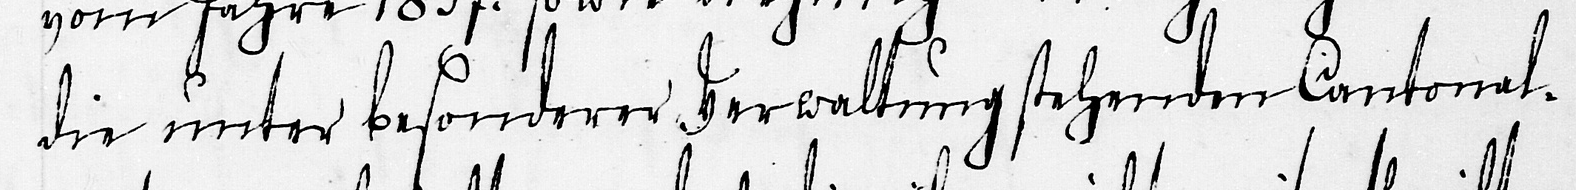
die unter besonderer Verwaltung stehenden Cantonal¬
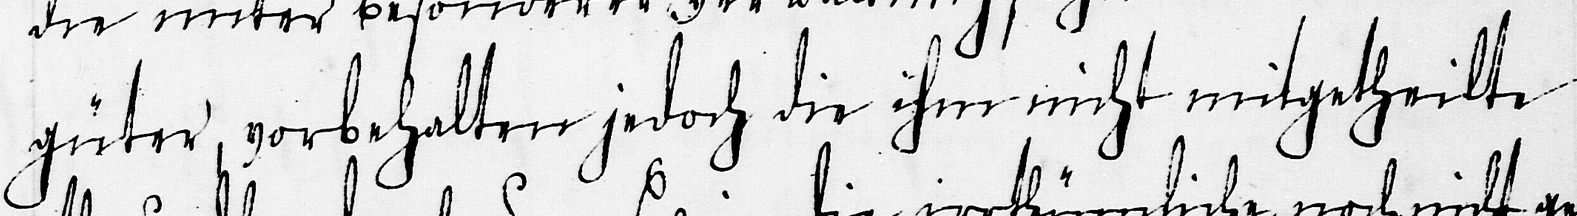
güter, vorbehalten jedoch die ihm nicht mitgetheilte
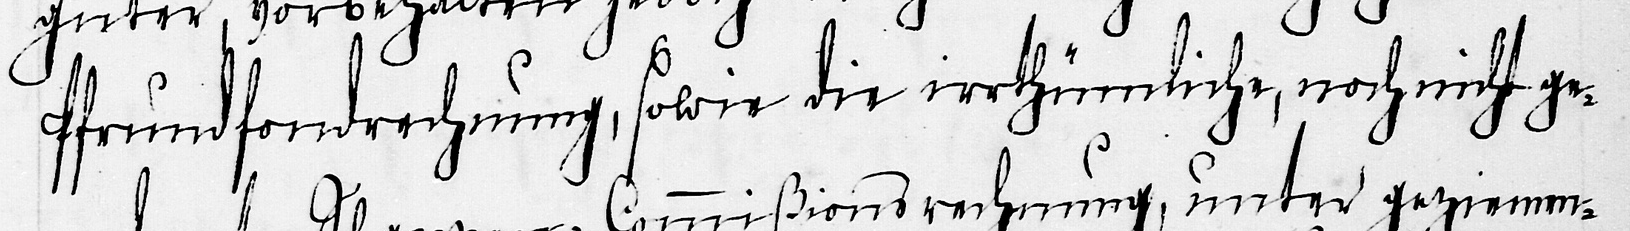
Pfrundfondrechnung, sowie die irrthümliche, noch nicht g¬
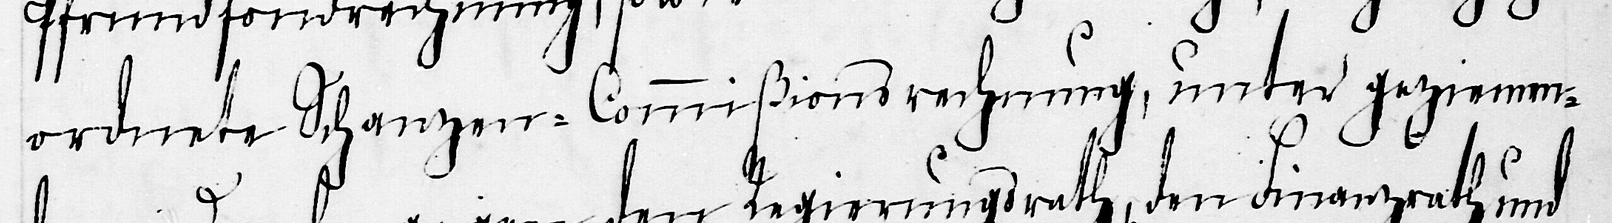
eordnete Schanzen-Commißionsrechnung, unter geziemen¬
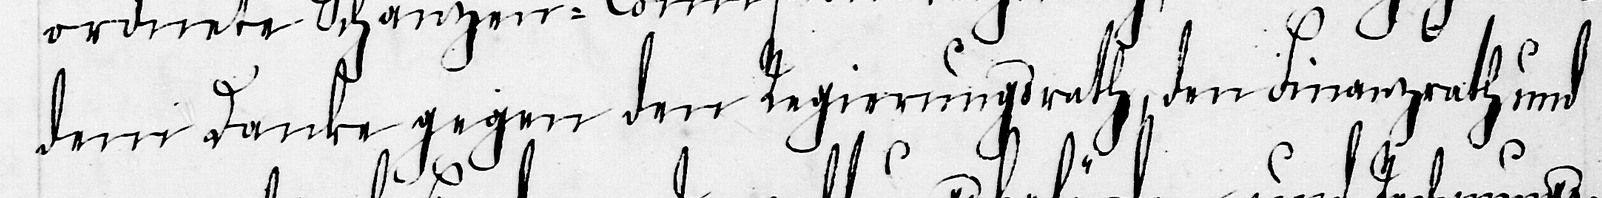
dem Danke gegen den Regierungsrath, den Finanzrath und
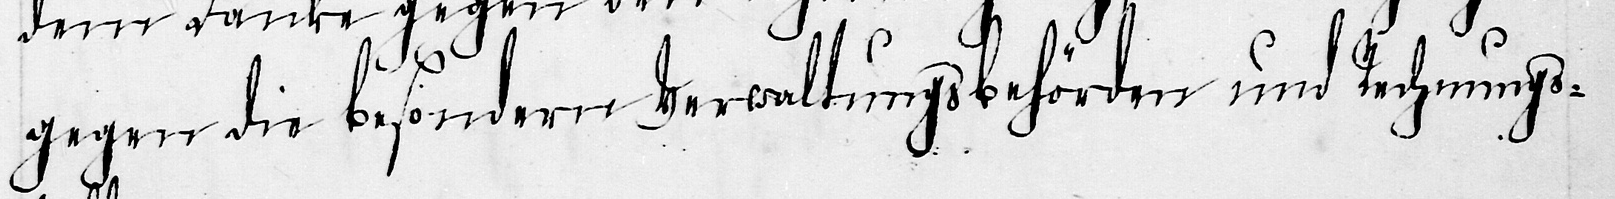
gegen die besondern Verwaltungsbehörden und Rechnungs¬
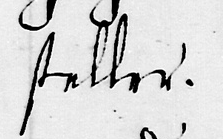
steller.
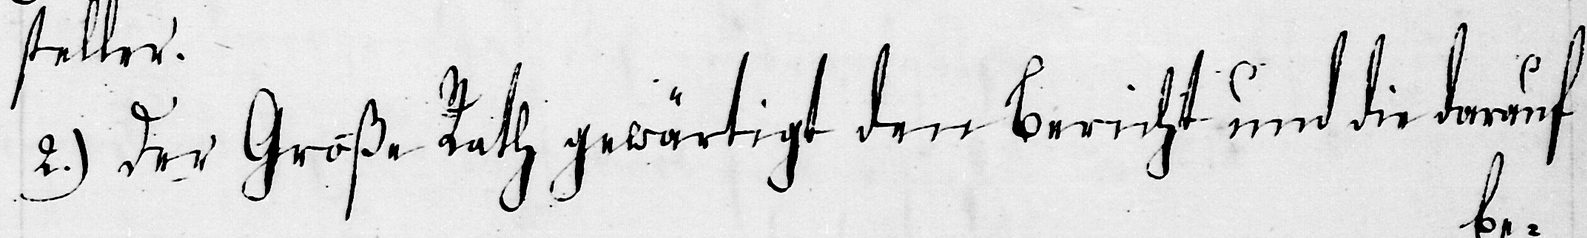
2.) Der Große Rath gewärtigt den Bericht und die darauf
